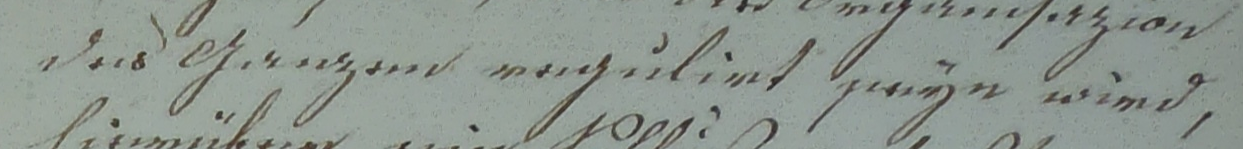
des Ganzen regulirt seyn wird,
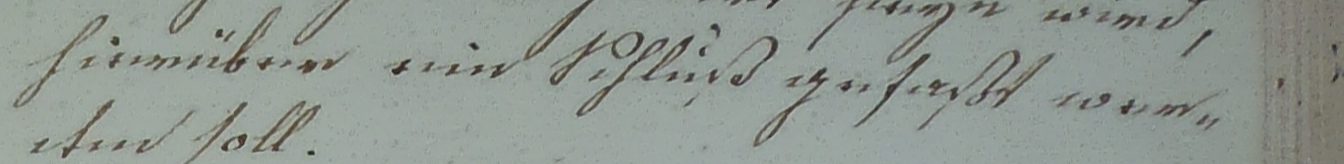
hierüber ein Schluß gefaßt wer¬
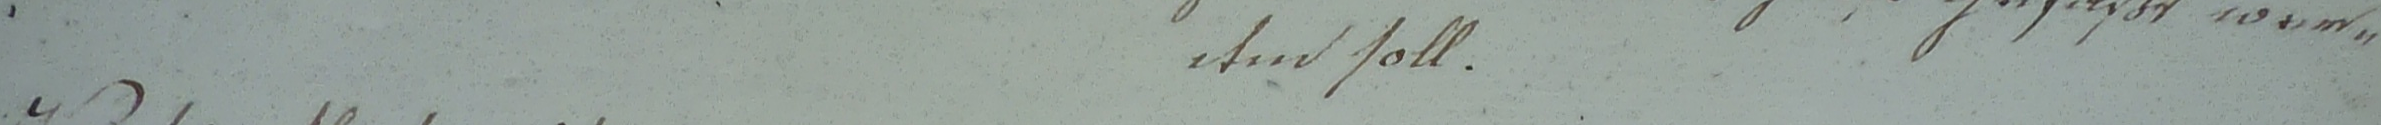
den soll.
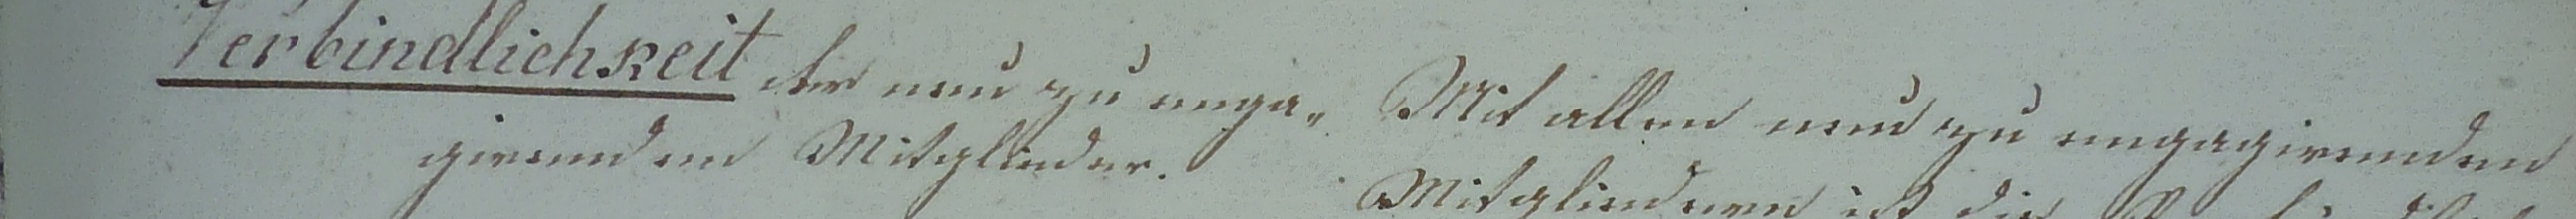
Verbindlichkeit der neu zu enga¬
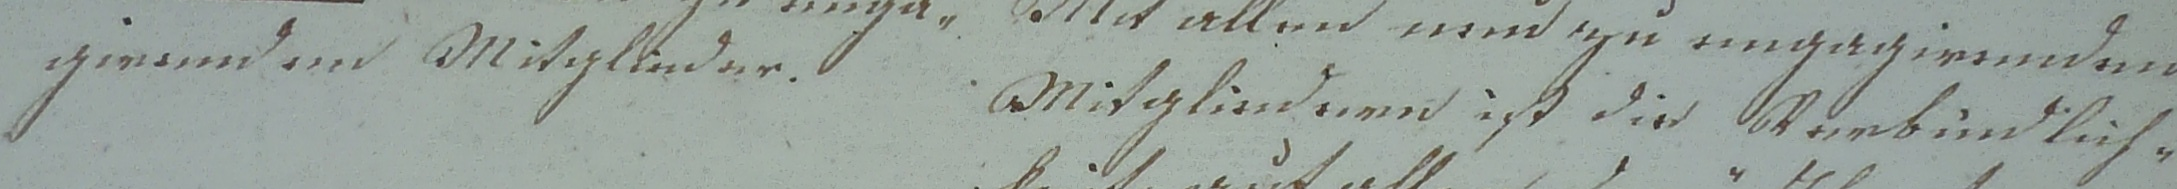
girenden Mitglieder.
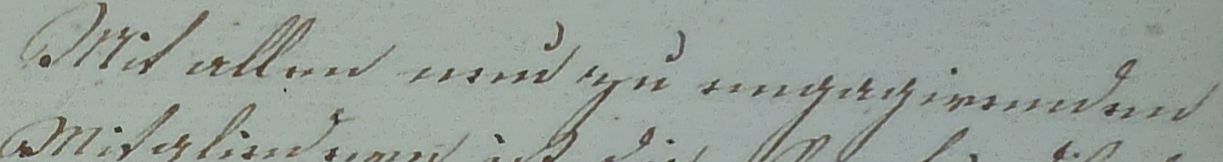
Mit allen neu zu engagirenden
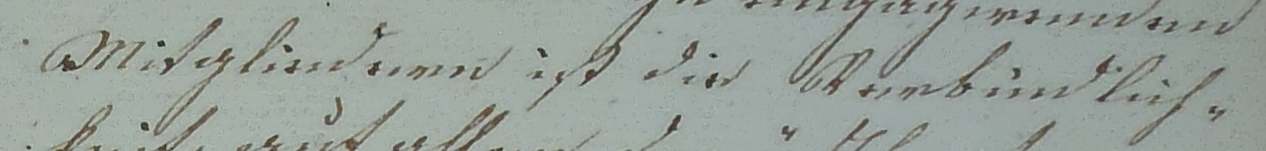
Mitgliedern ist die Verbindlich¬
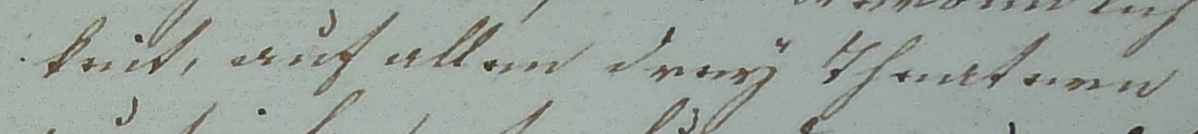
keit, auf allen drey Theatern
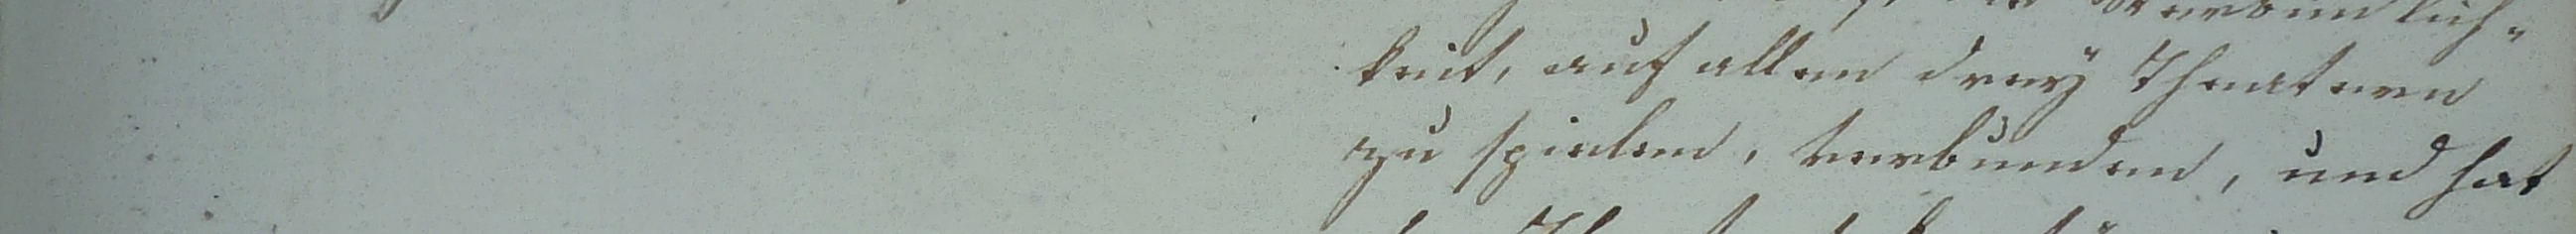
zu spielen, verbunden, und hat
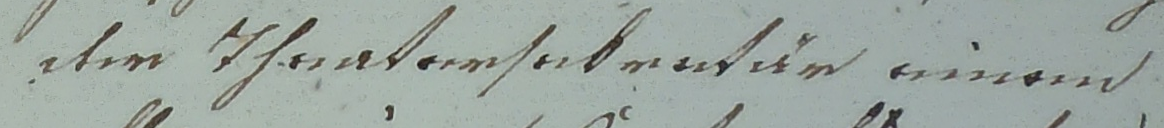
der Theatersekretär einen
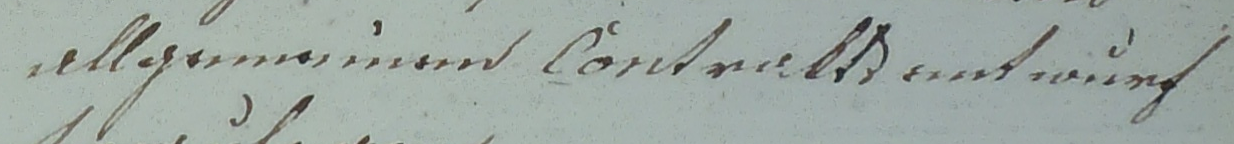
allgemeinen Contractsentwurf
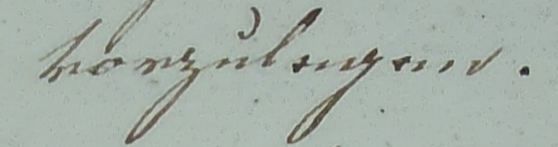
vorzulegen.
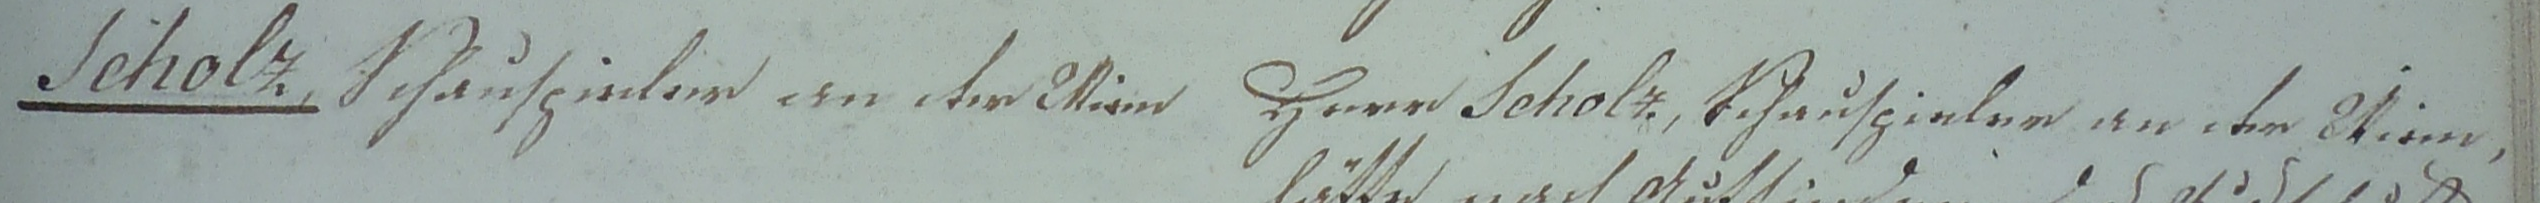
Scholz, Schauspieler an der Wien Herr Scholz, Schaupieler an der Wien,
